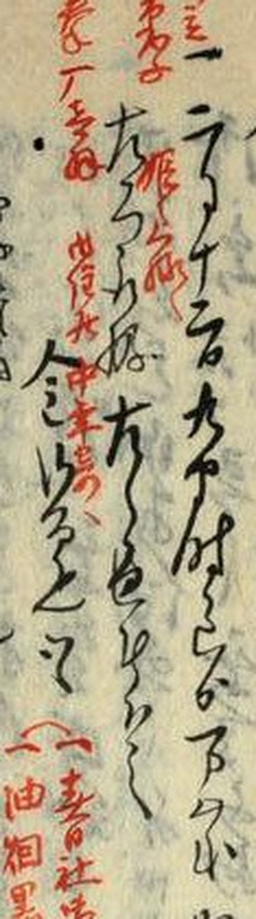左衛門取扱左之通被下之
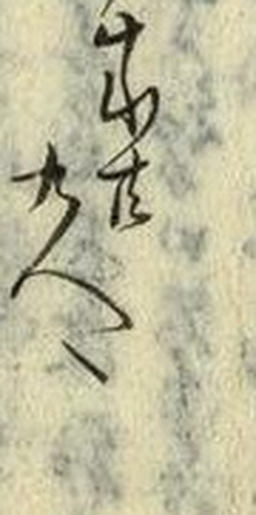十六日
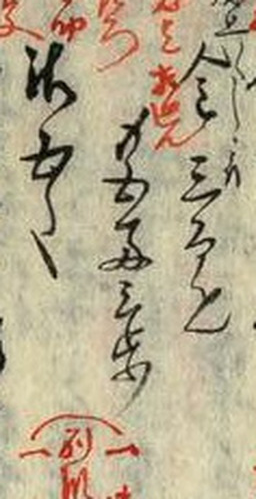〆五両三歩
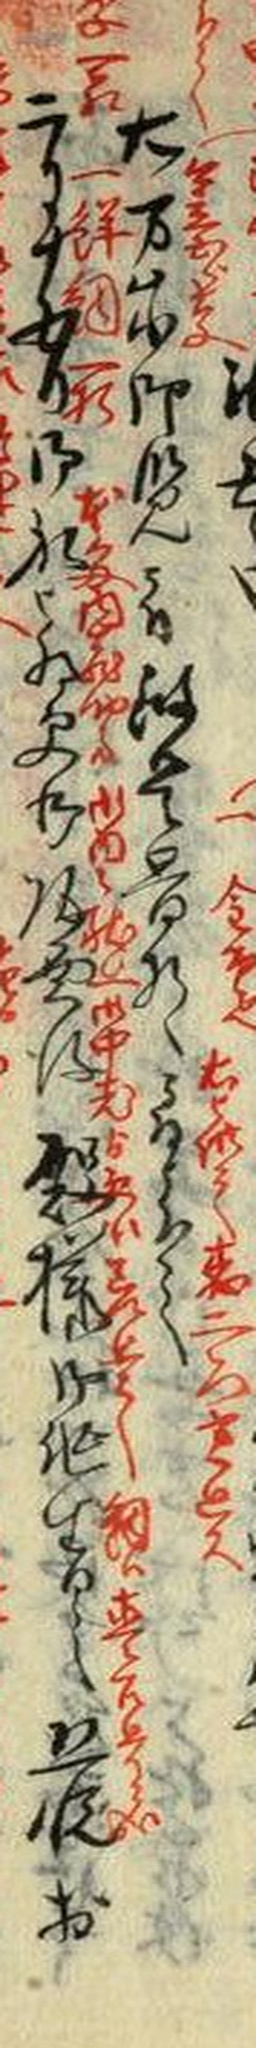二月十五日御礼被為受御帰殿後御殿様御誕生日之恐悦於
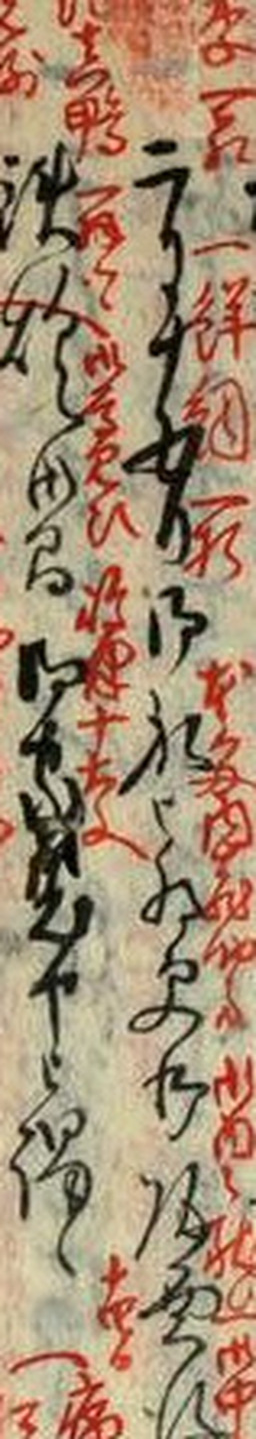鉄炮之間御家老中被謁候

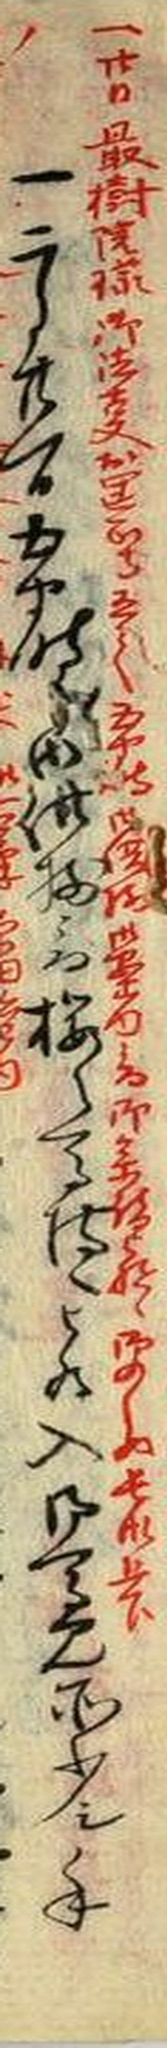一二月廿一日五半時御供揃ニ而桜之馬場へ被為入御馬見所少シ手
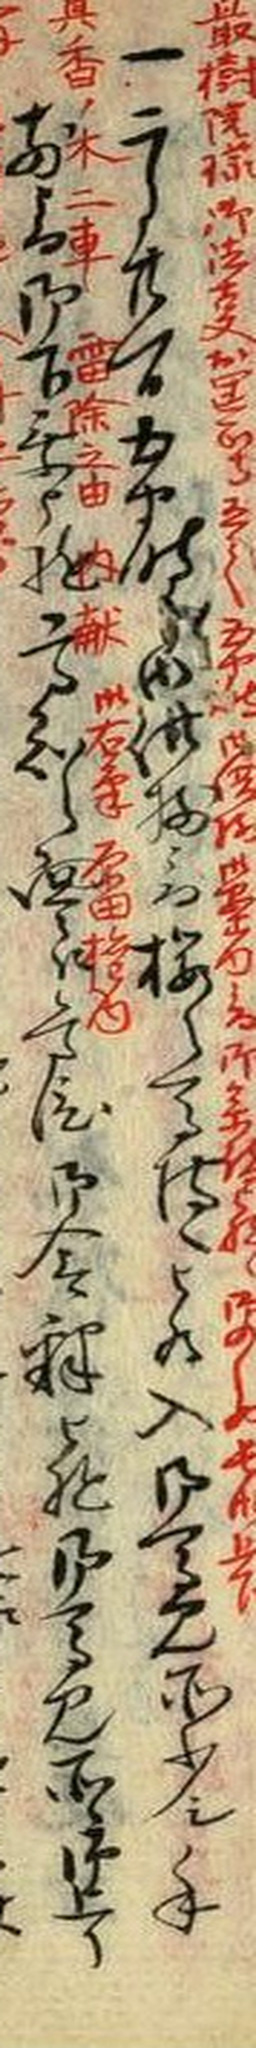前ニ而御下乗被遊高知之面々江鳥渡御会釈被遊候御馬見所へ御上り
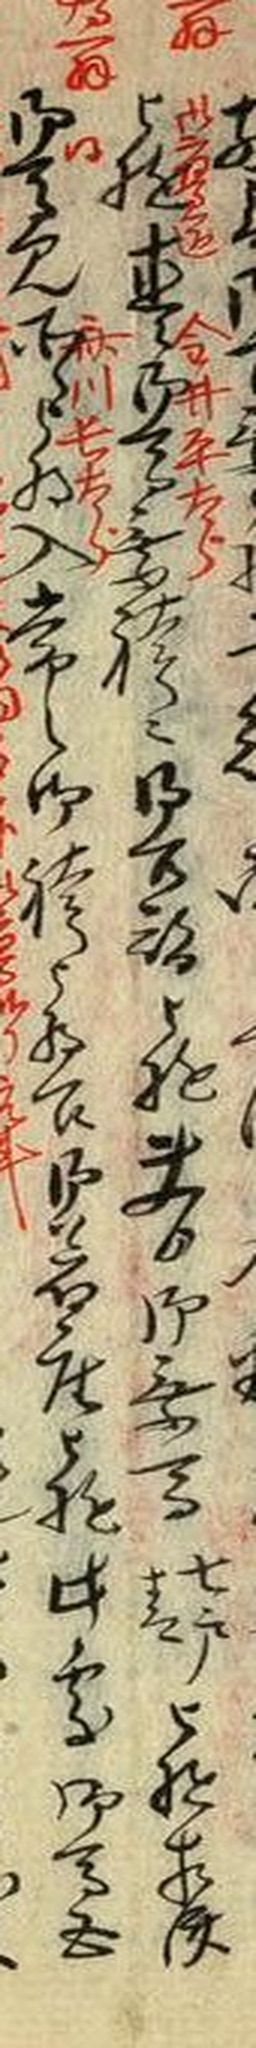御馬見所へ被為入常之御袴被為召御着座被遊此処御馬五
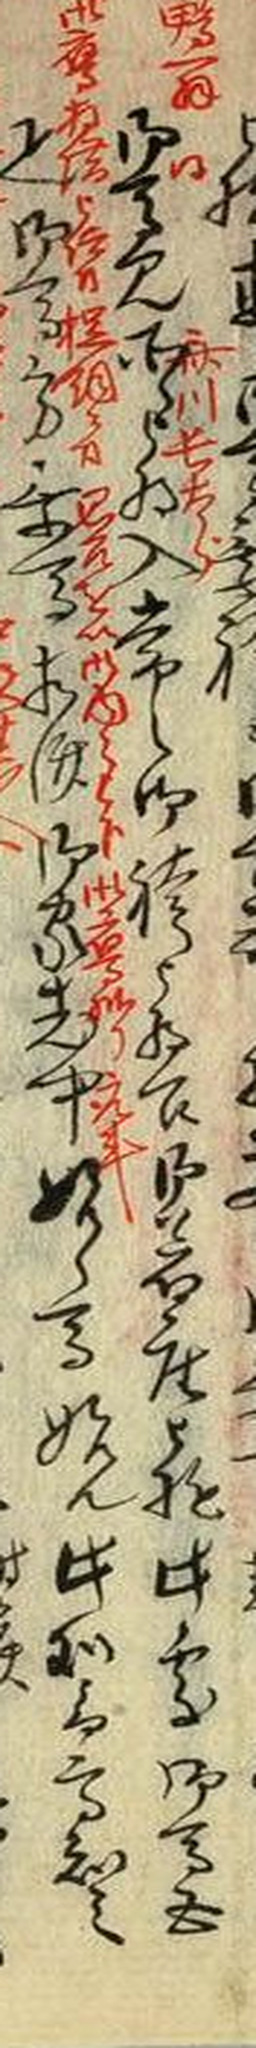疋御馬方乗馬相済御家老中始之馬始ル此処ニ而高知之
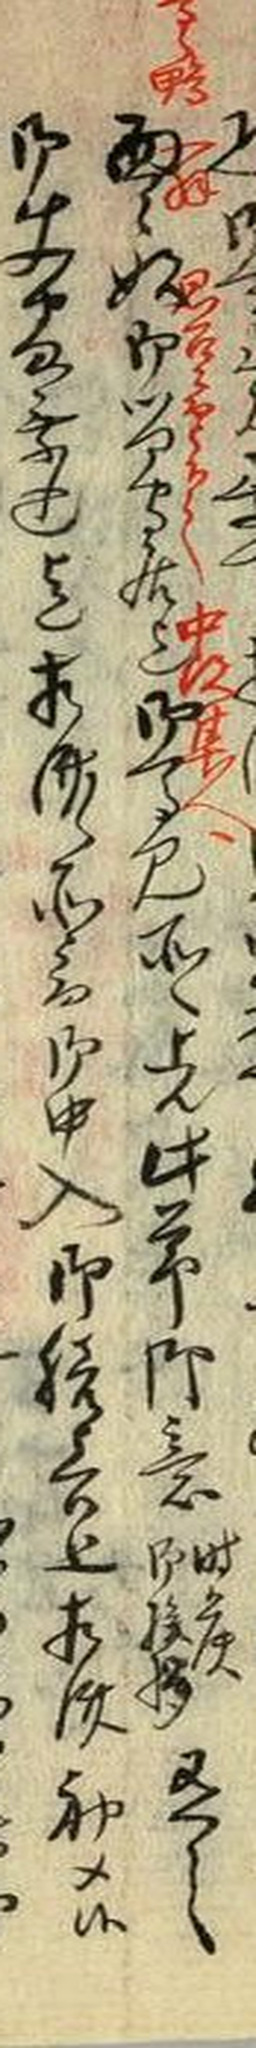御使番乗込迄相済候所ニ而御中入御膳被召上相済初メ候
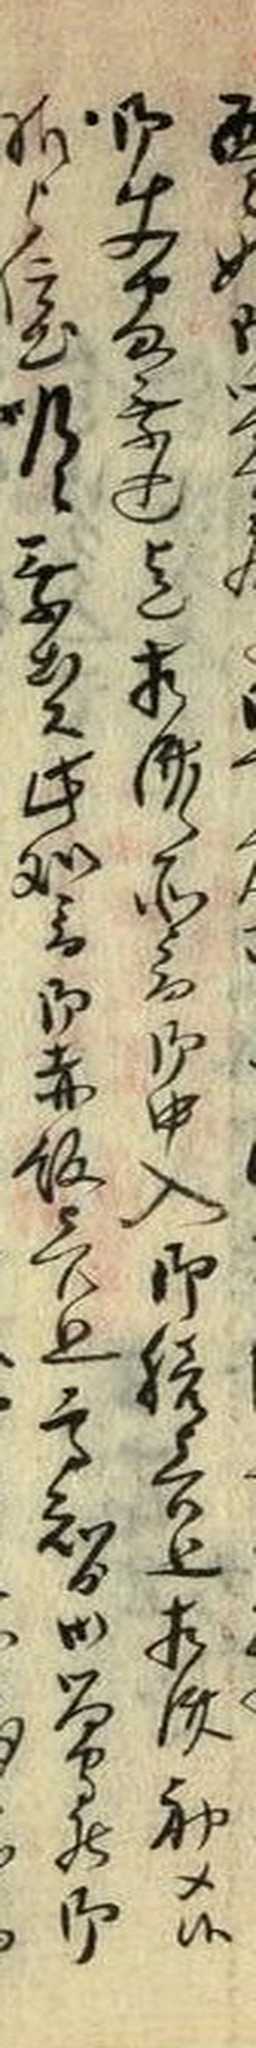様被仰出順ニ乗出ス此処ニ而御赤飯被召上高知ゟ御留守居御
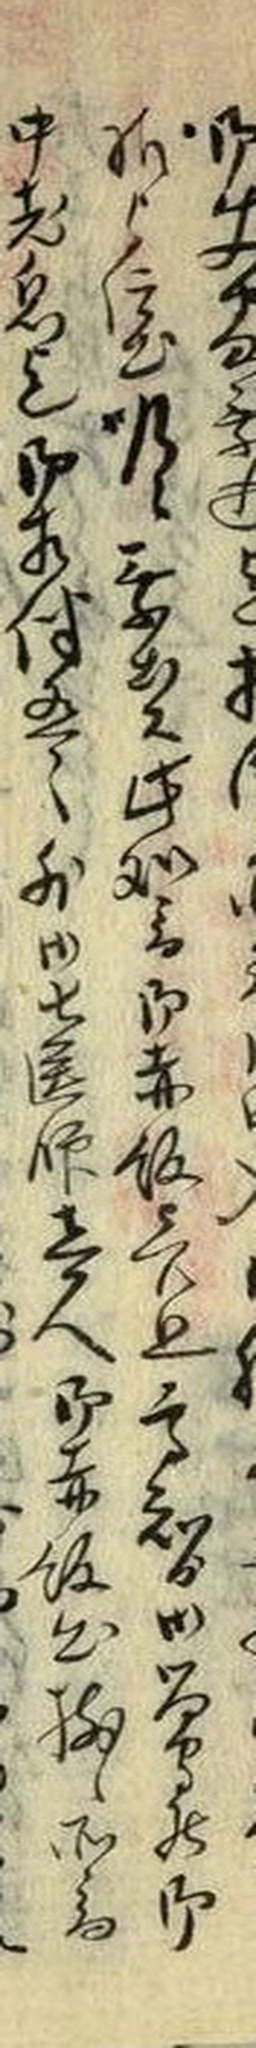中老息迄御相伴有之外御匙医師壱人御赤飯出揃候所ニ而
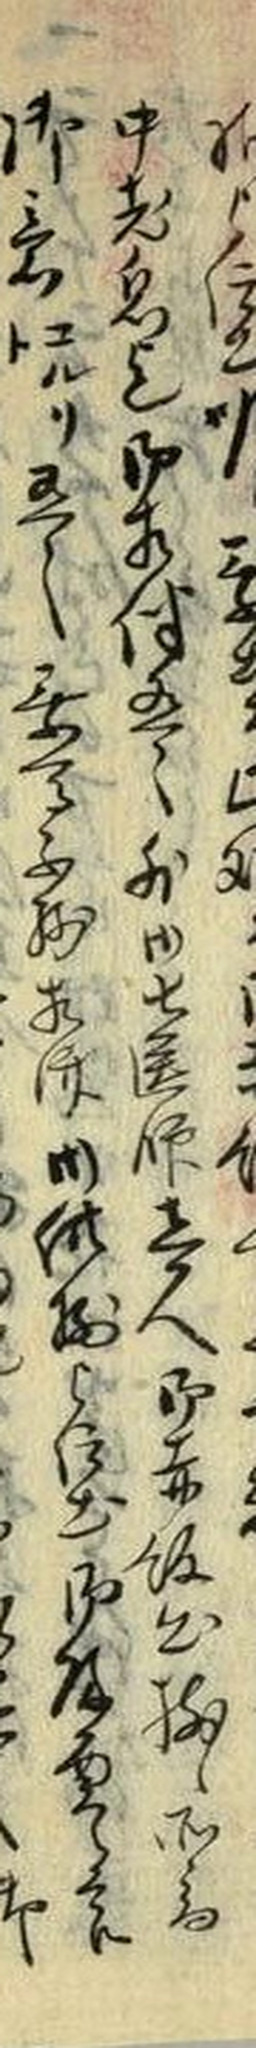ト有之乗馬不残相済御供揃被仰出御帰殿之節
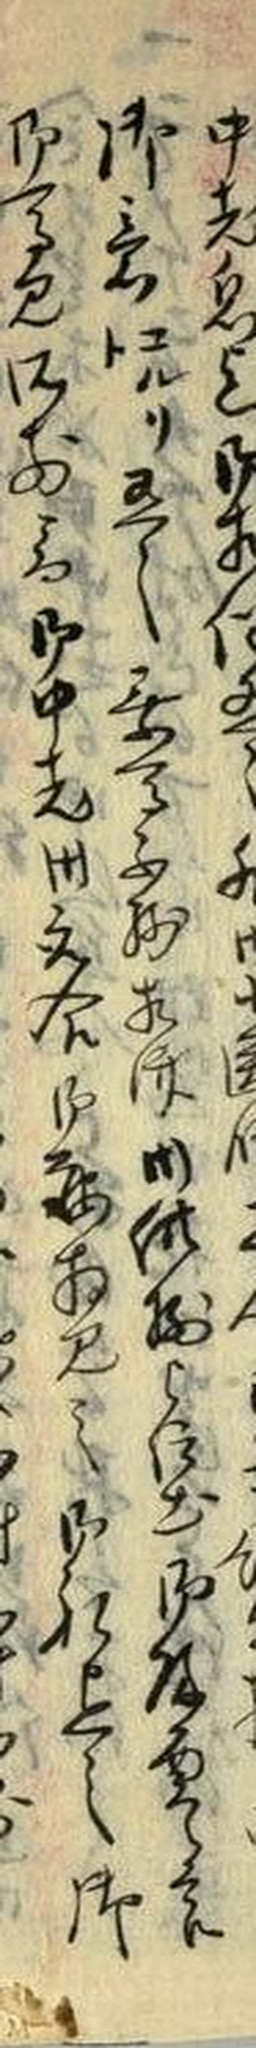御馬見所前ニ而御中老御取合御鞍拝見之御礼申上之御
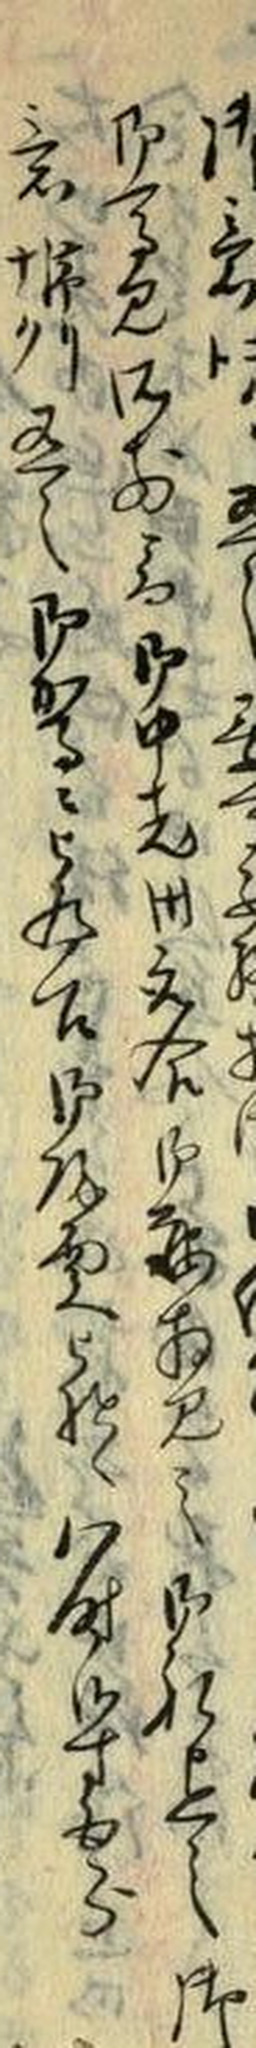ナク有之御駕ニ被為召御帰殿被遊候八時弐寸五分
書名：少傅日録抄（斉承付側向頭取日記、在国）
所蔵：福井県文書館 Fukui Prefectural Archives
